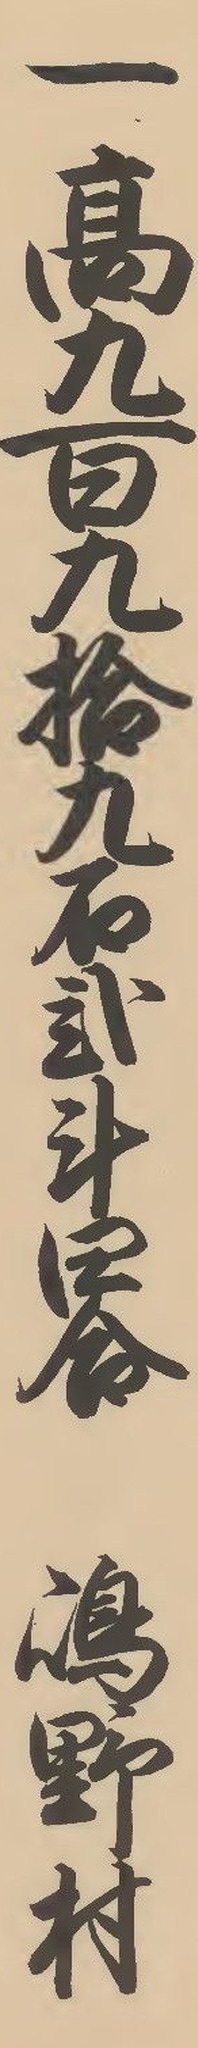一髙九百九拾九石弐斗四合嶋野村

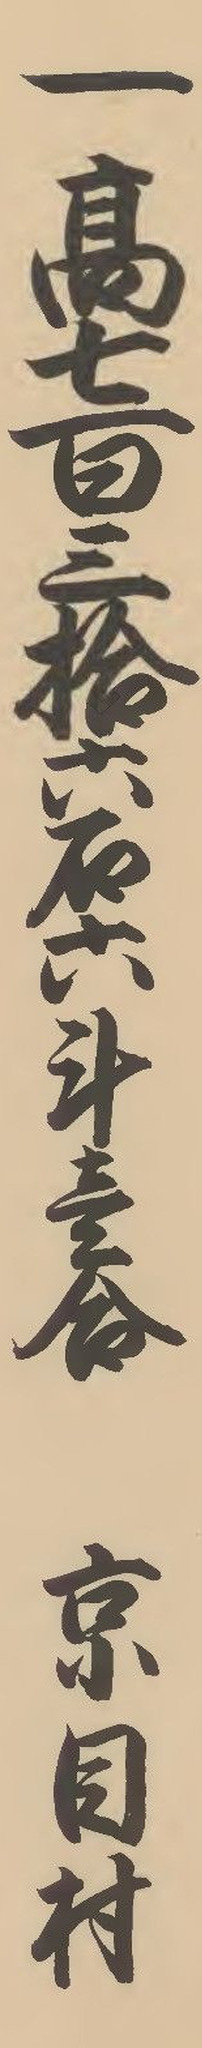一髙七百三拾六石六斗壱合京目村
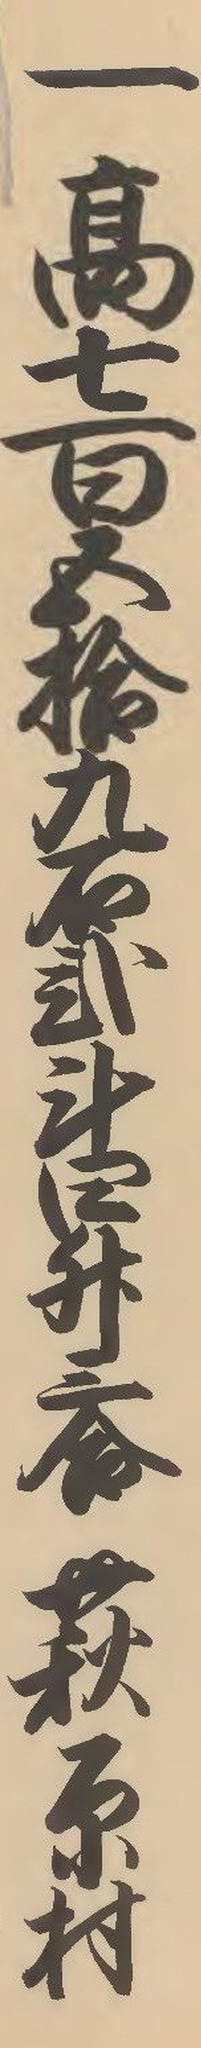一髙七百五拾九石弐斗四升三合萩原村
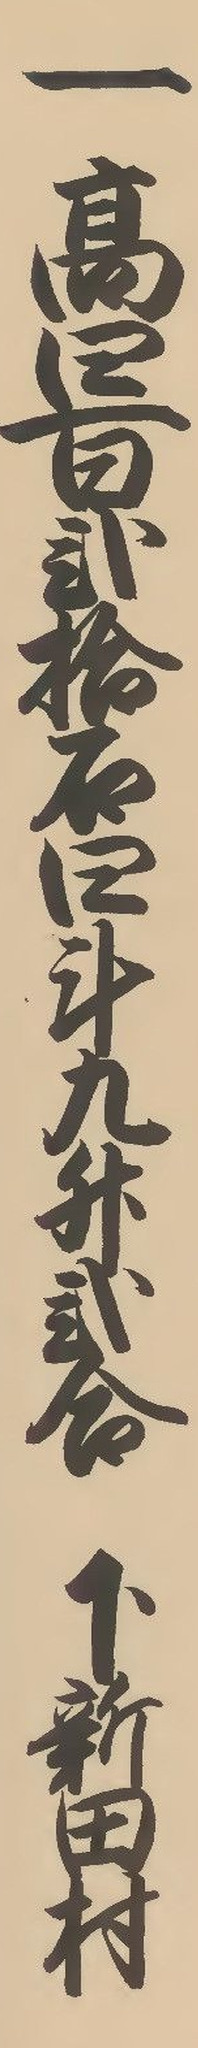一髙四百弐拾石四斗九升弐合下新田村
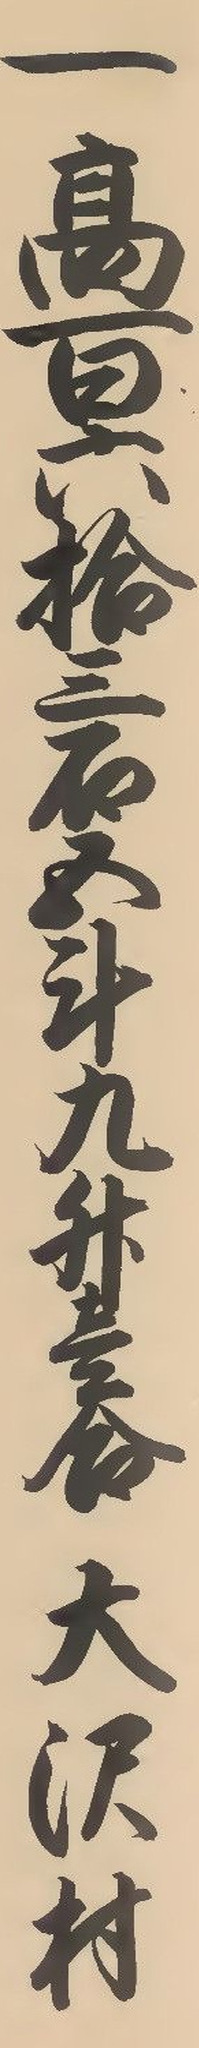一髙百六拾三石五斗九升壱合大沢村
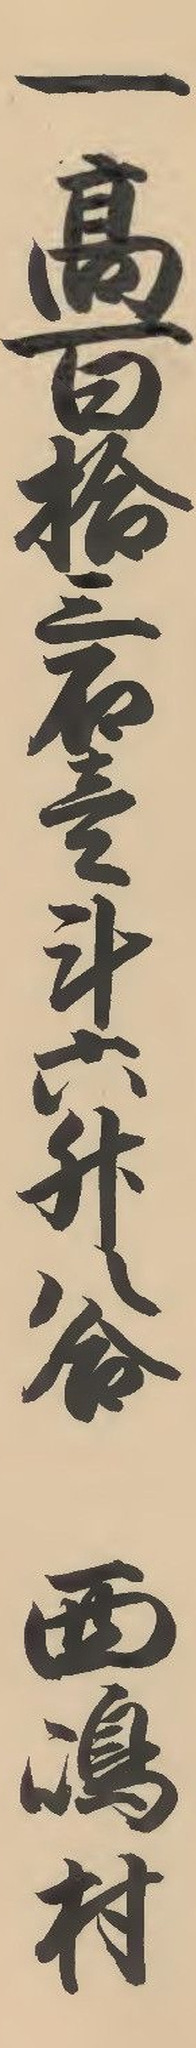一髙百拾三石壱斗六升八合西嶋村
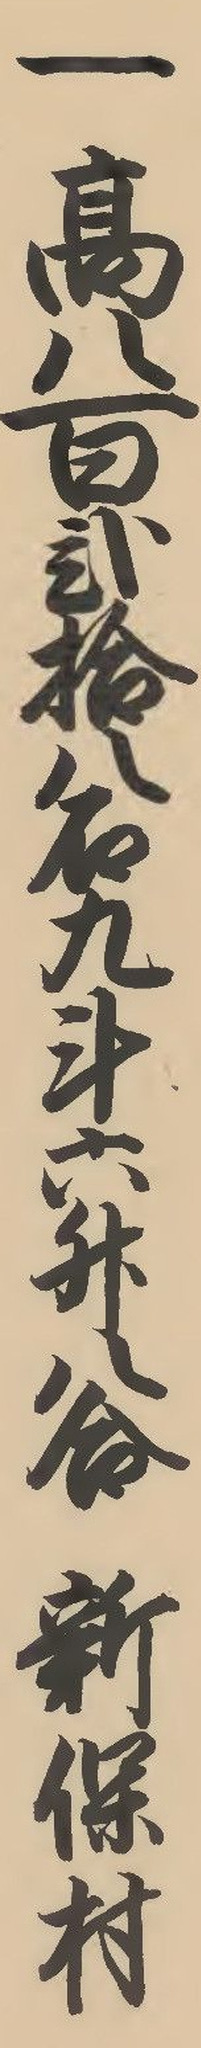一髙八百弐拾八石九斗六升八合新保村
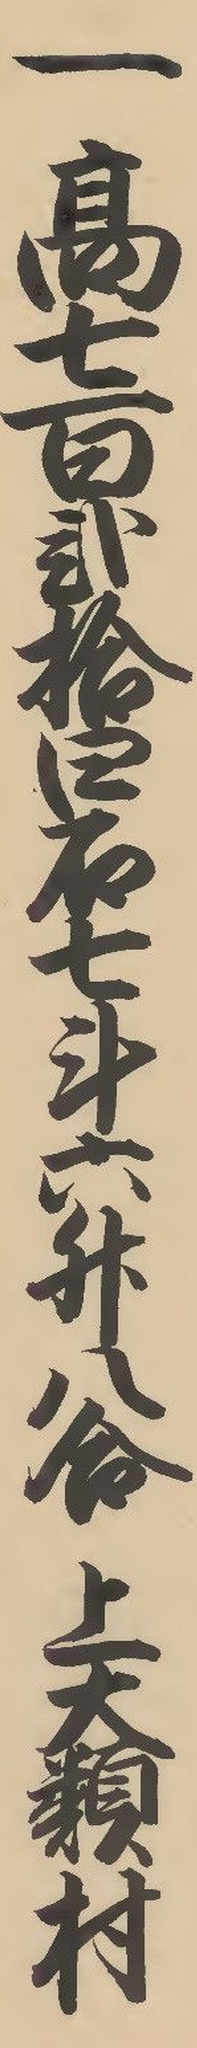一髙七百弐拾四石七斗六升八合上大類村

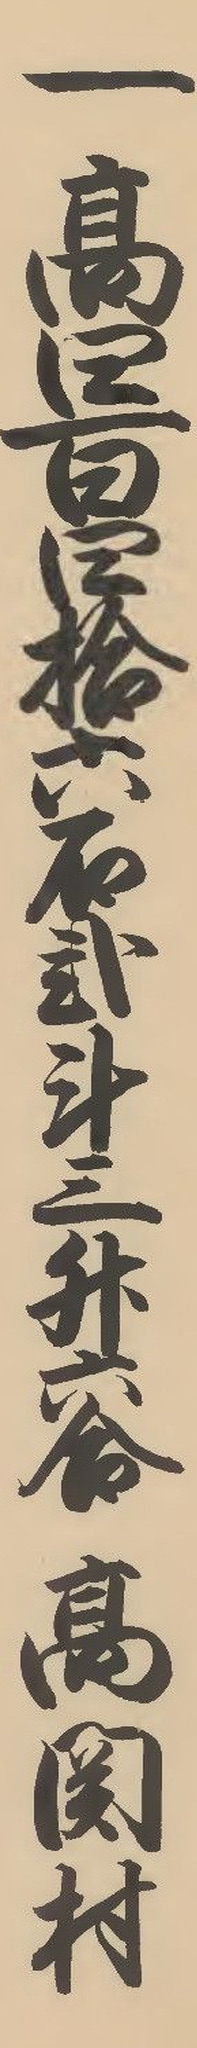一髙四百四拾六石弐斗三升六合高関村
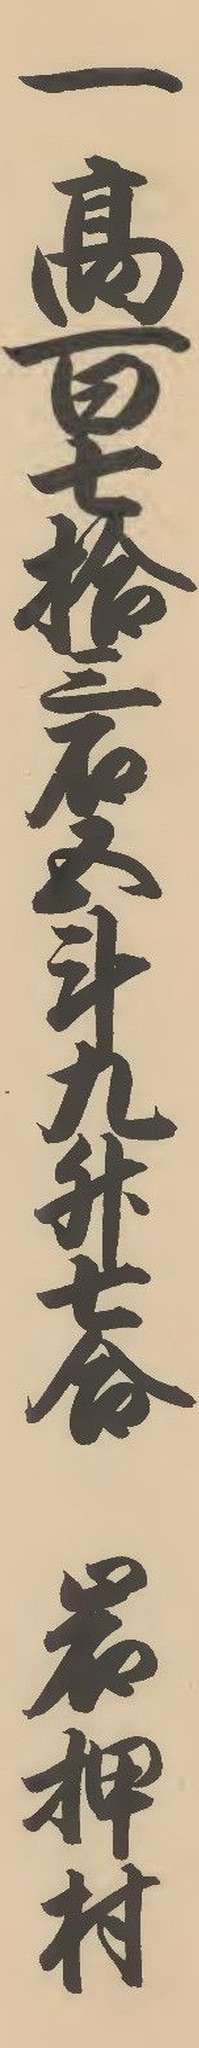一髙百七拾三石五斗九升七合岩押村
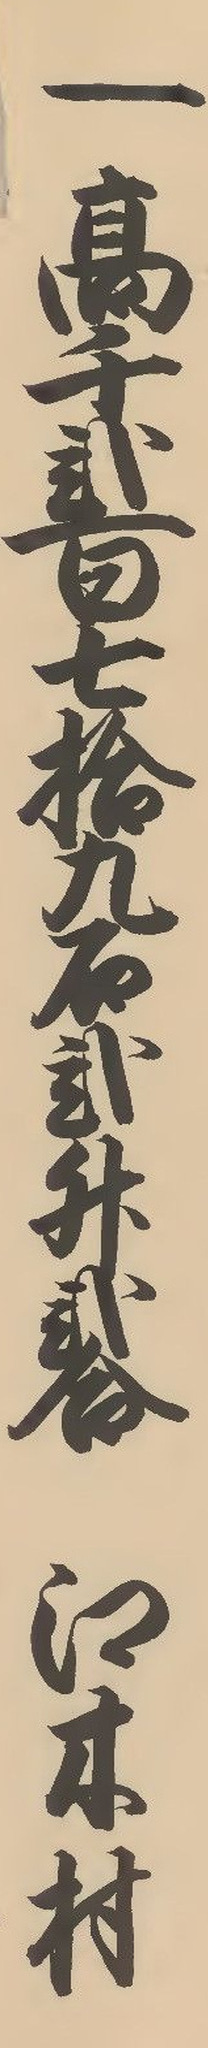一髙千弐百七拾九石弐升弐合江木村
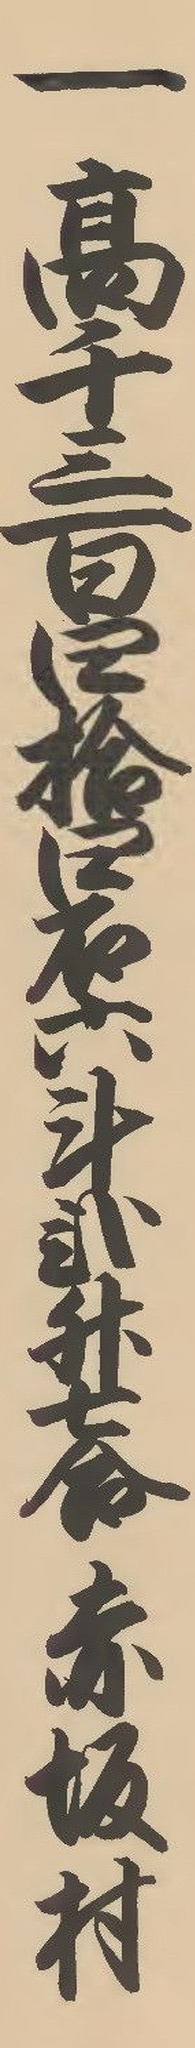一髙千三百四拾四石六斗弐升七合赤坂村
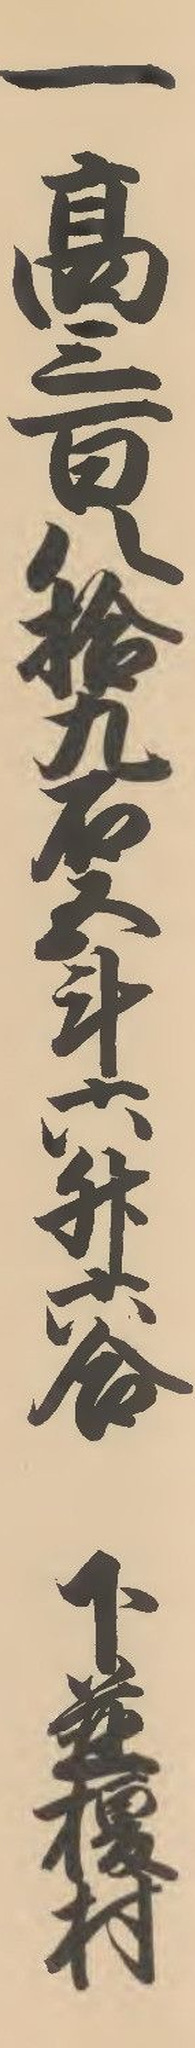一髙三百八拾九石五斗六升六合下並村
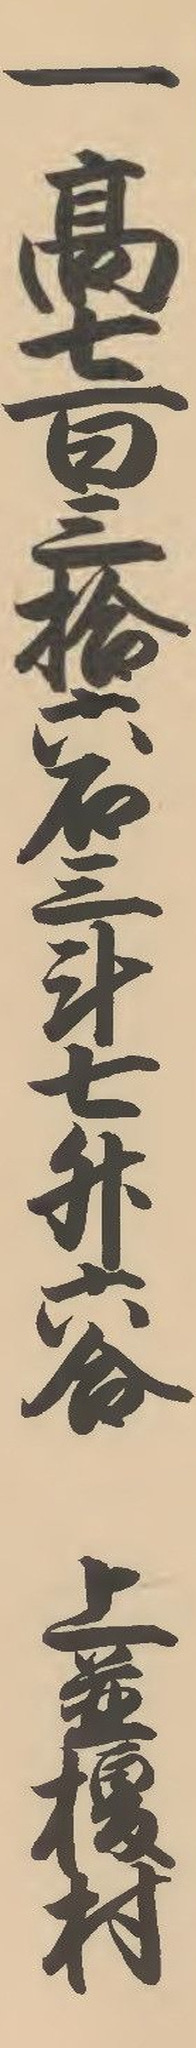一髙七百三拾六石三斗七升六合上並村
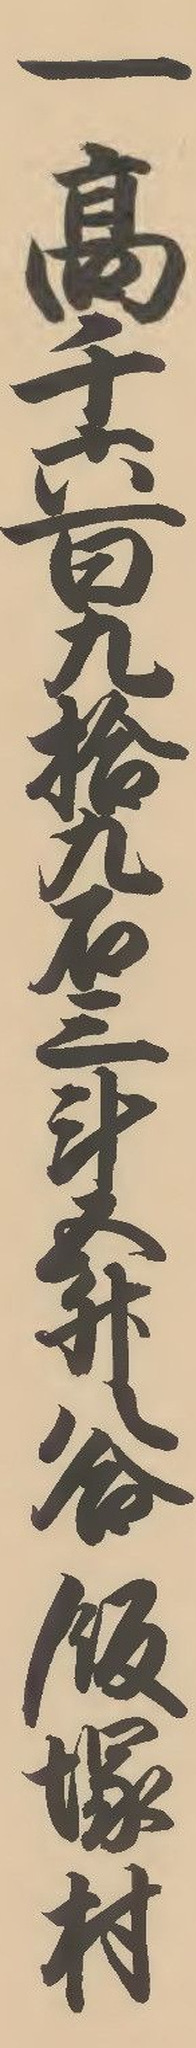一髙千六百九拾九石三斗五升八合飯塚村
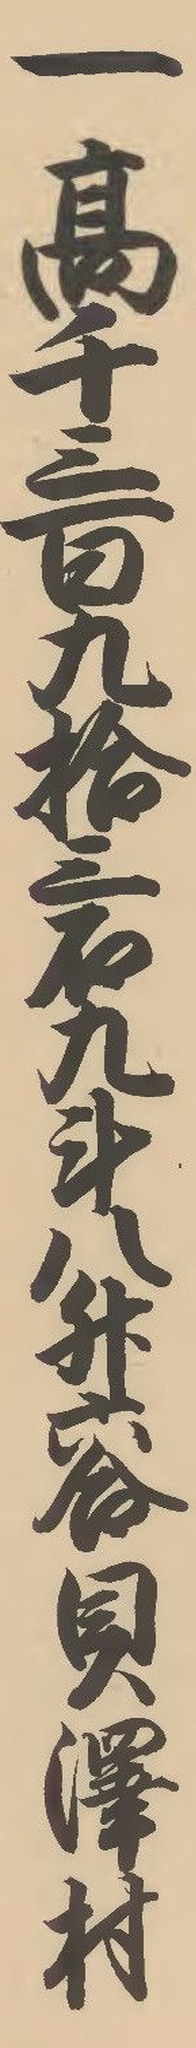一髙千三百九拾三石九斗八升六合貝澤村
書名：上野国郷帳
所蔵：国立公文書館 National Archives of Japan
